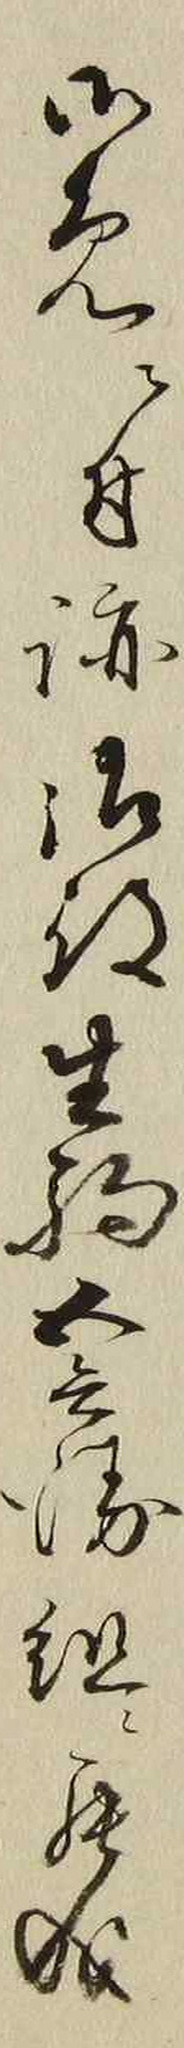御免に付跡御役生駒五兵衛組に罷成
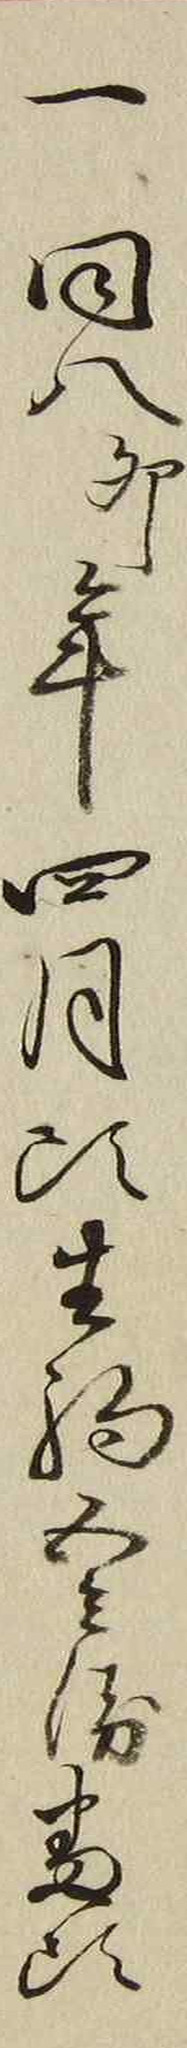一同八卯年四月頭生駒五兵衛番頭
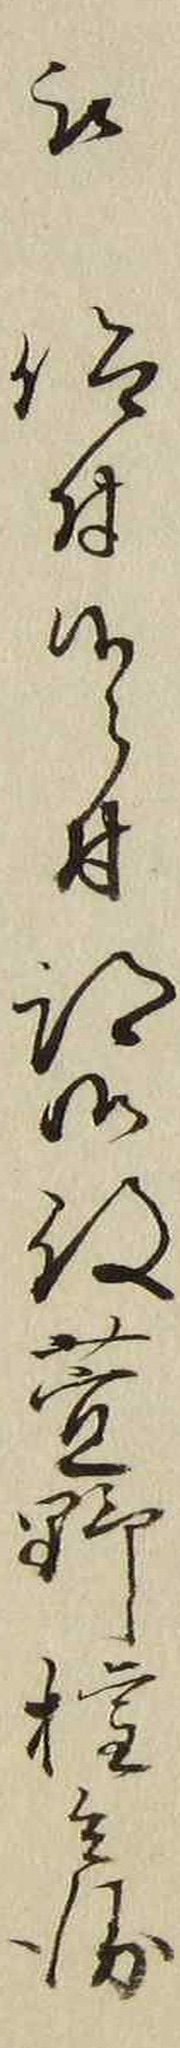被仰付候に付跡御役萱野権兵衛
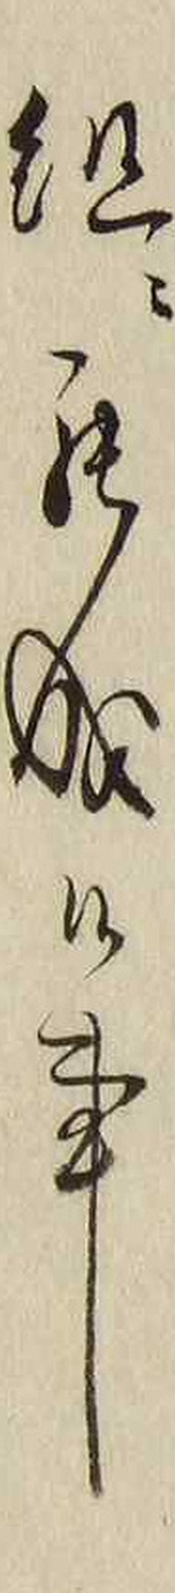組に罷成候事

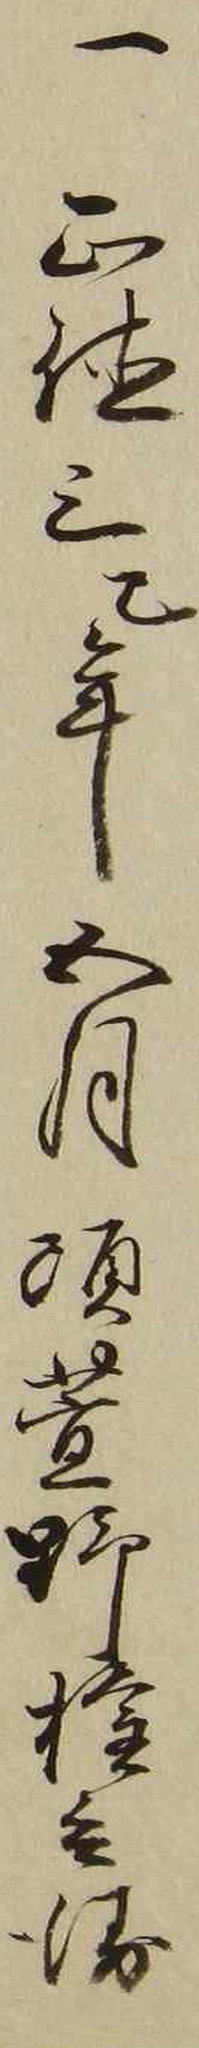一正徳三巳年五月頭萱野権兵衛
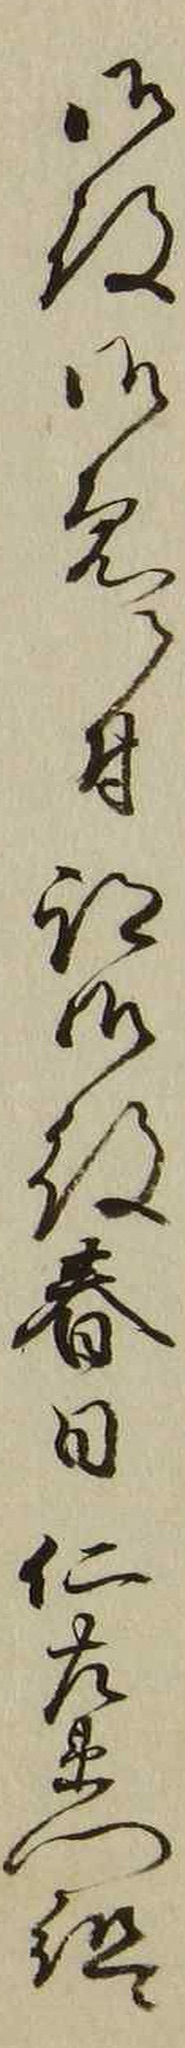御役御免に付跡御役春日仁左衛門組に
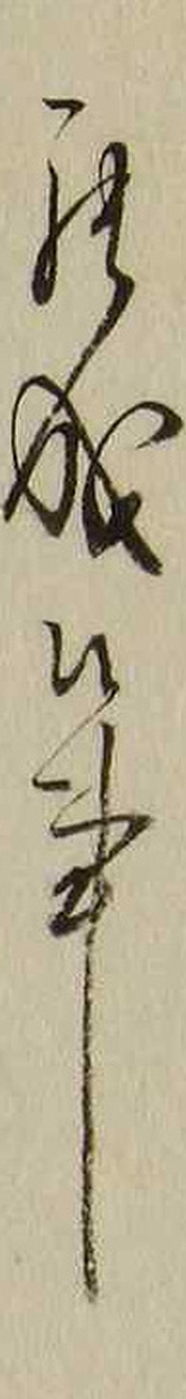罷成候事
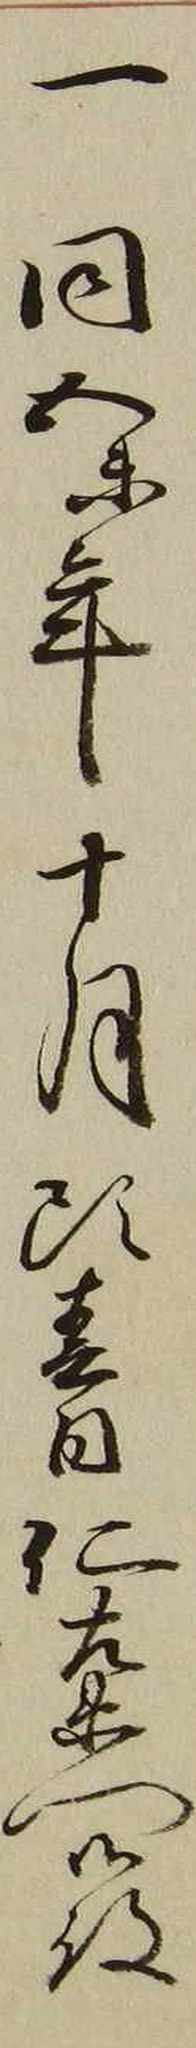一同五未年十月頭春日仁左衛門御役
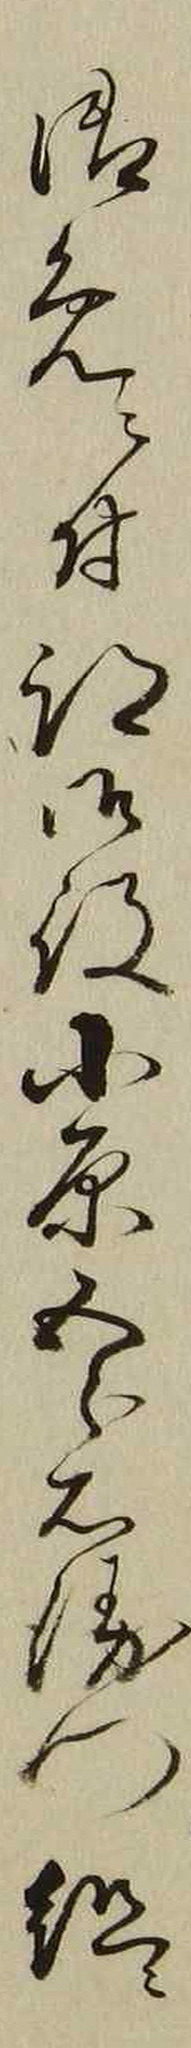御免に付跡御役小原五郎右衛門組に
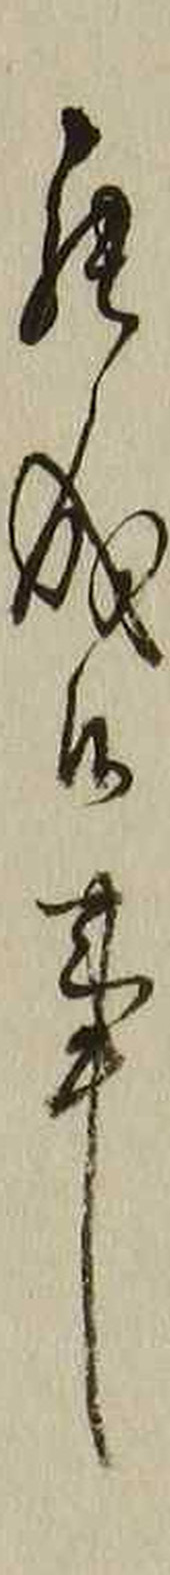罷成候事
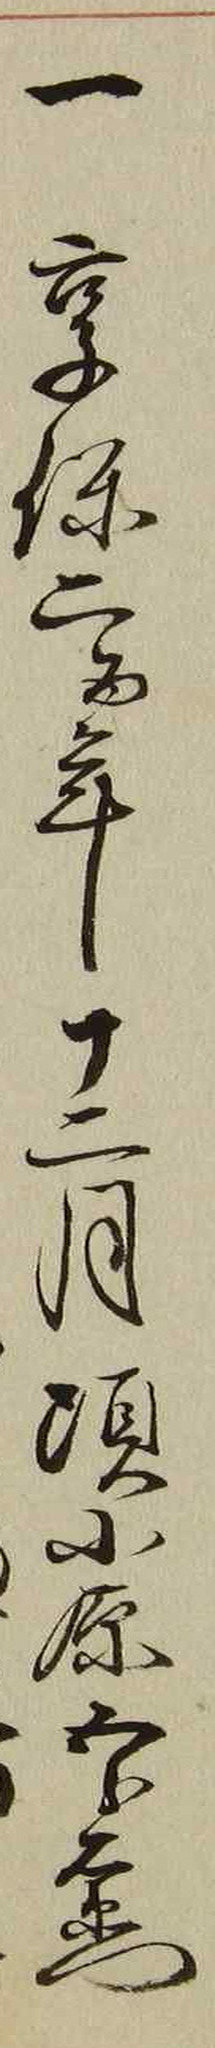一享保二酉年十二月頭小原五郎右衛門
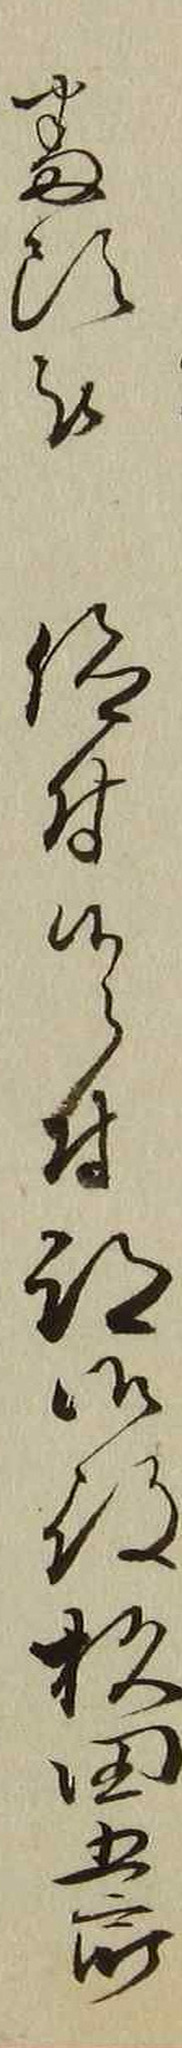番頭被仰付候に付跡御役杉田五郎
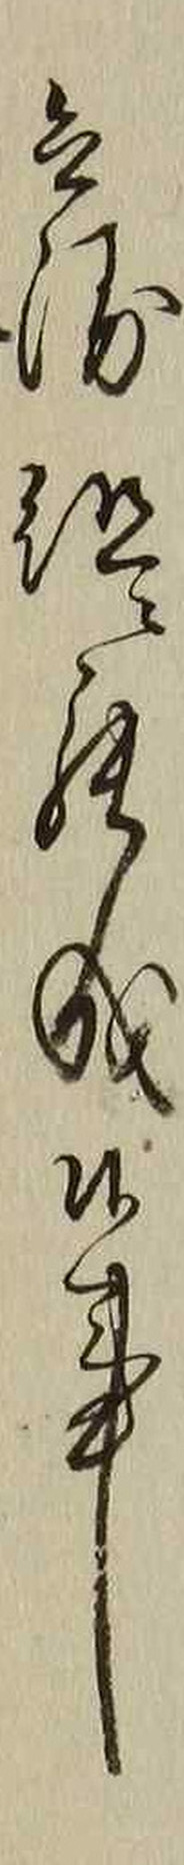兵衛組に罷成候事
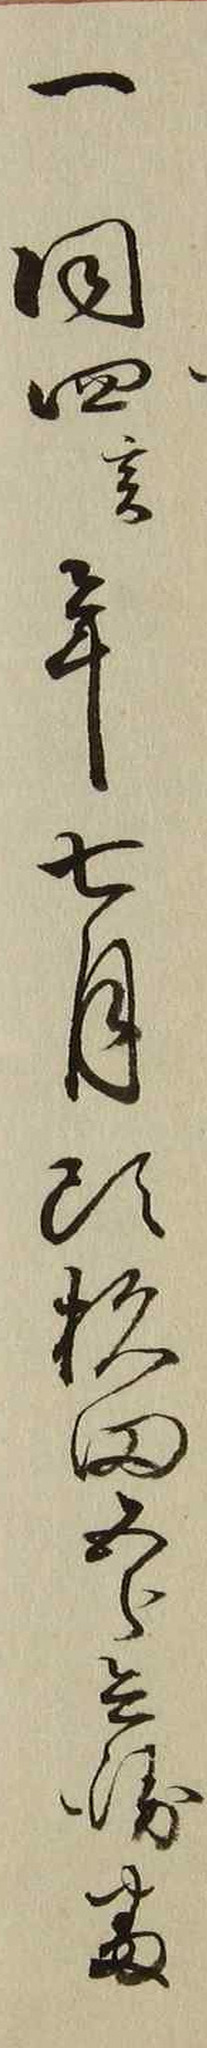一同四亥年七月頭杉田五郎兵衛番
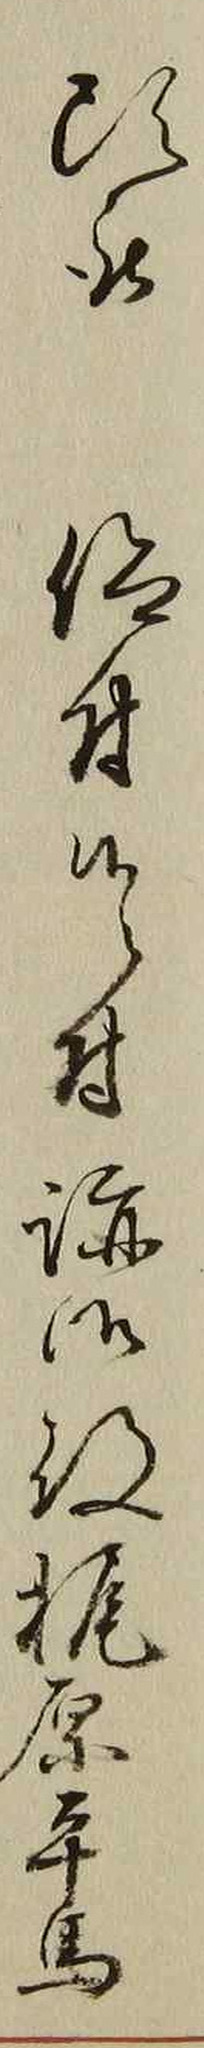頭被仰付候に付跡御役梶原平馬
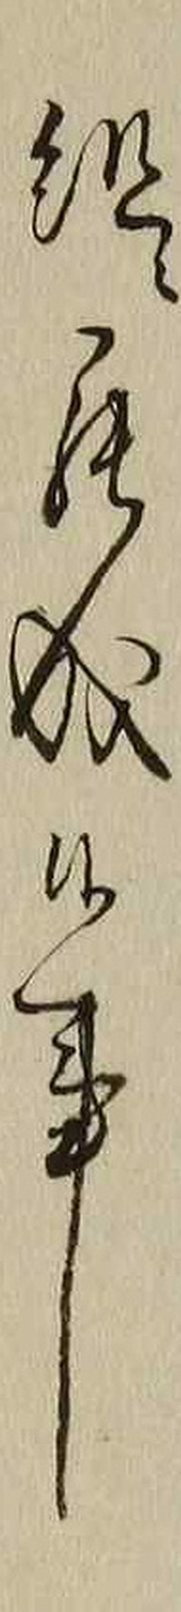組に罷成候事
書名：諸士系譜　巻之1　い之部1
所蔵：会津若松市立会津図書館
